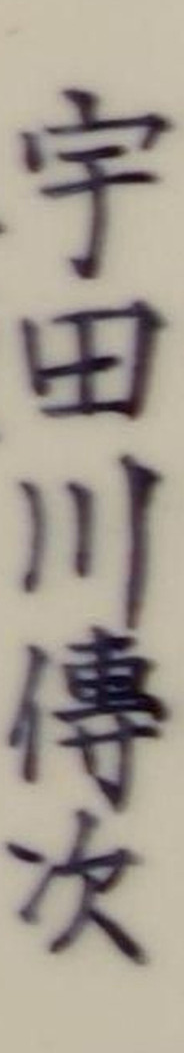宇田川傳次
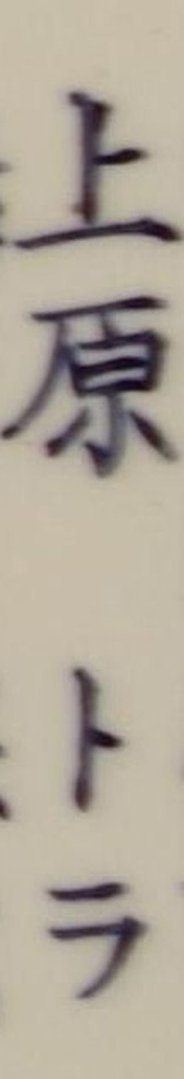上原トラ
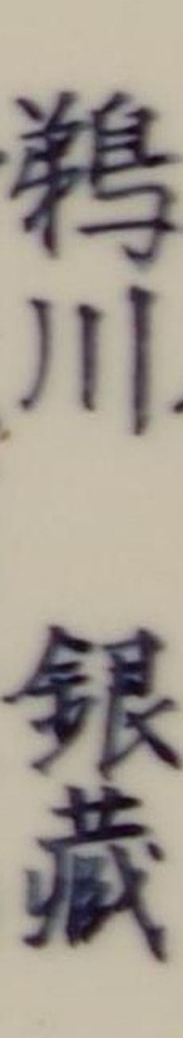鵜川銀蔵
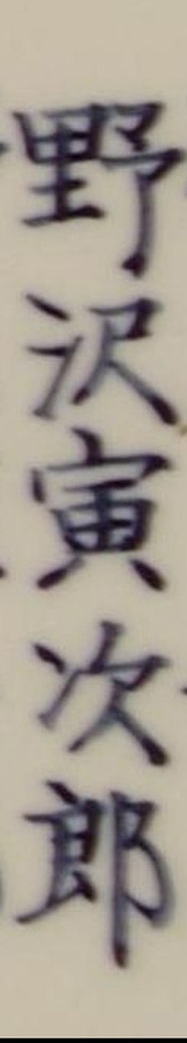野沢寅次郎
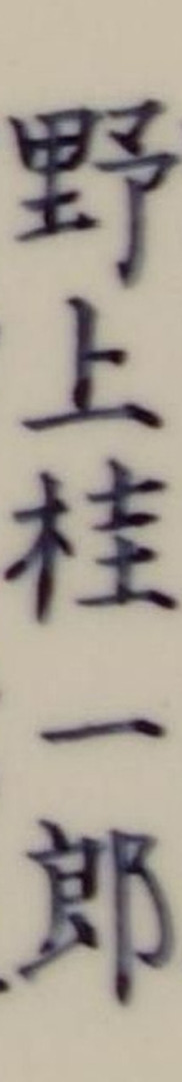野上桂一郎
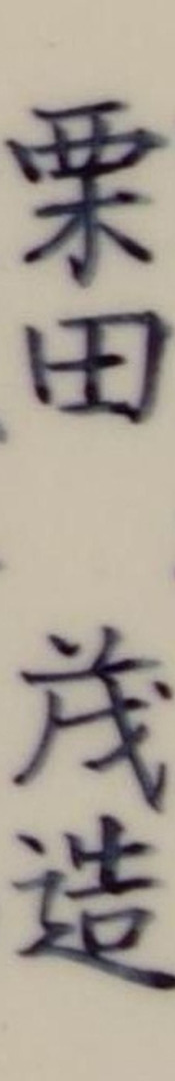栗田茂造
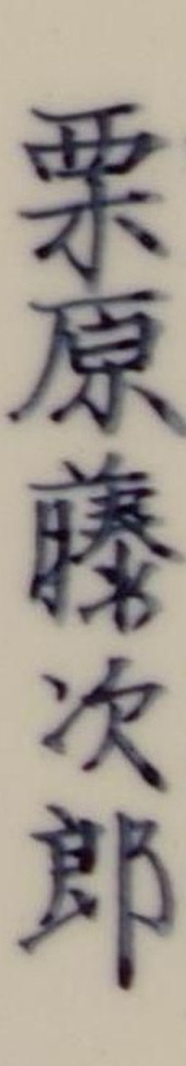栗原藤次郎
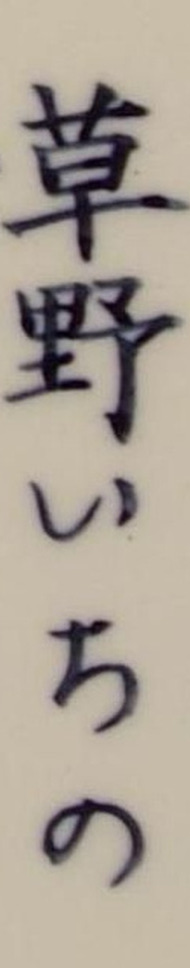草野いちの
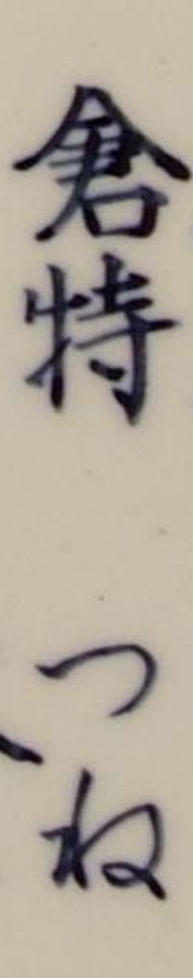倉特つね
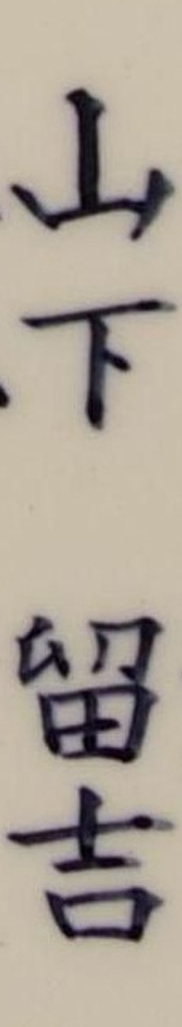山下留吉
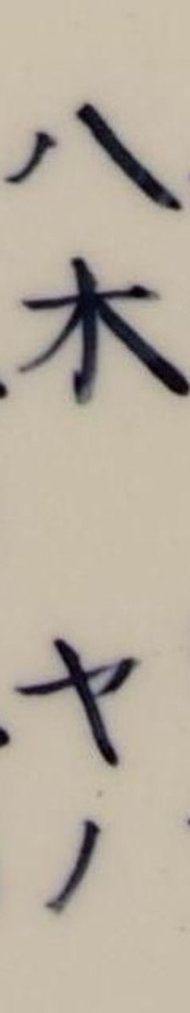八木ヤノ
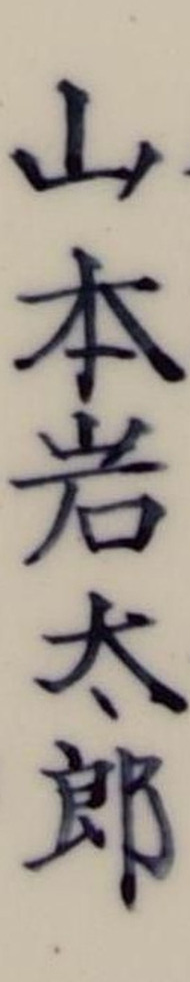山本岩太郎
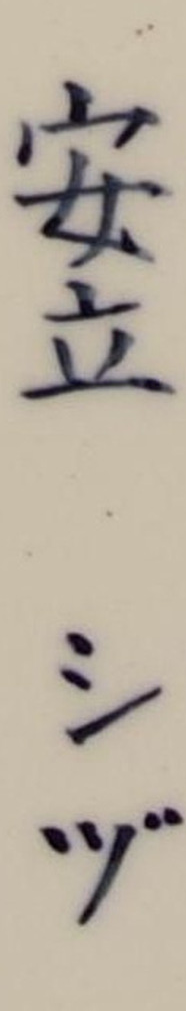安立シヅ
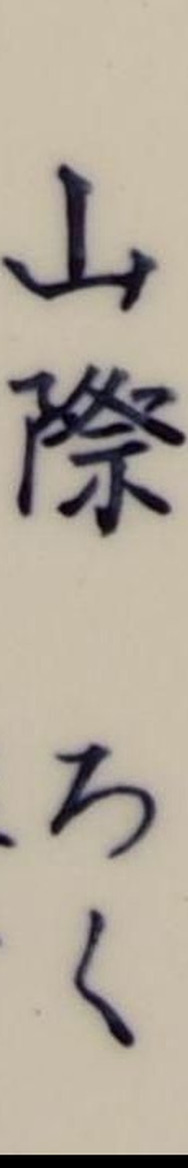山際ろく
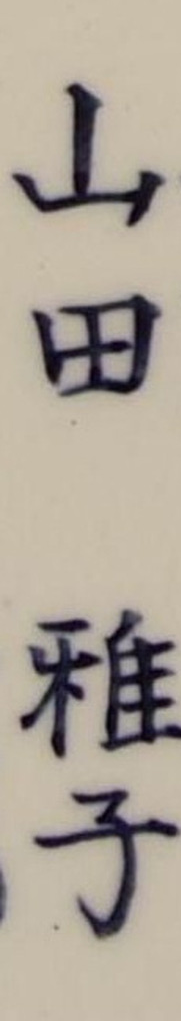山田雅子

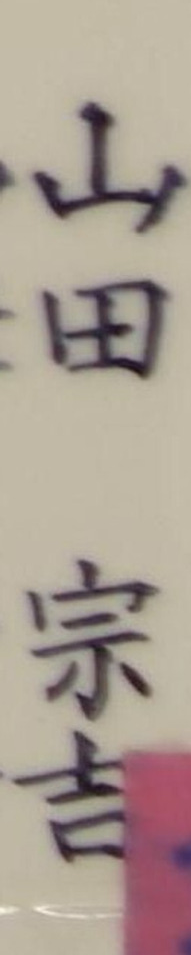山田宗吉
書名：E~L
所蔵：高野山金剛峯寺
